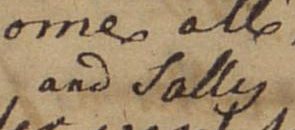and Sally
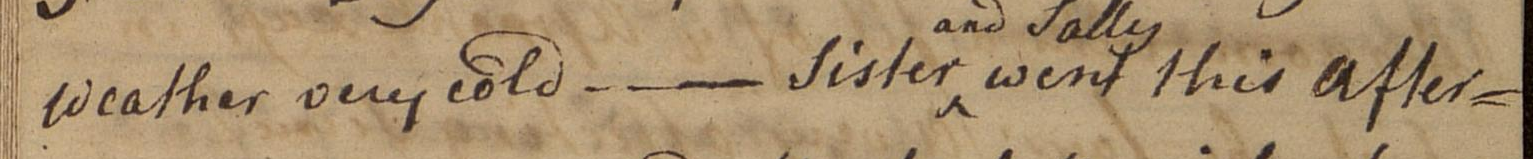Weather very cold-- Sister ^ went this after-
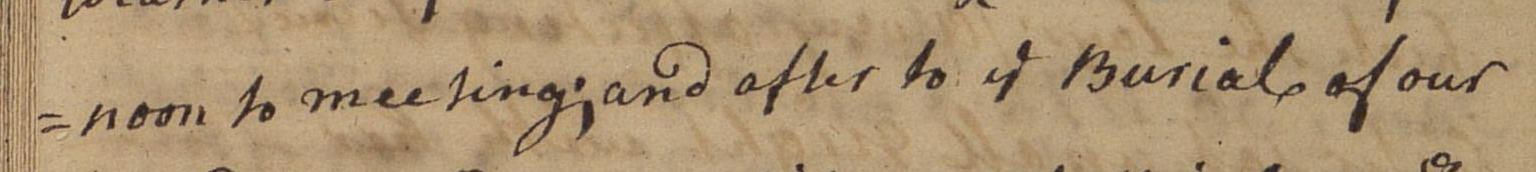-noon to meeting and after to y^e Burial of our
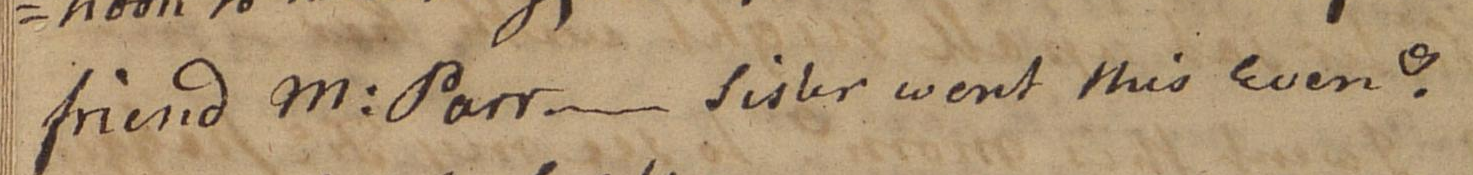friend M: Parr- Sister went this Even^g.
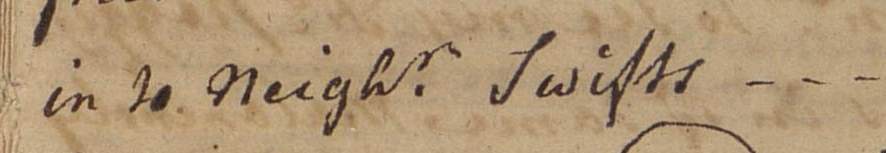in to Neigh^r. Swifts-
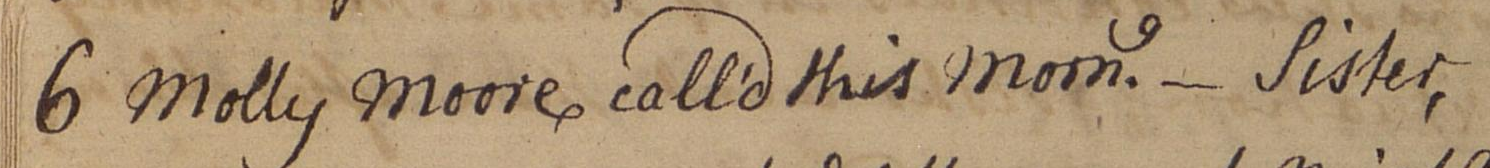6 Molly Moore call'd this morn^g.- Sister,
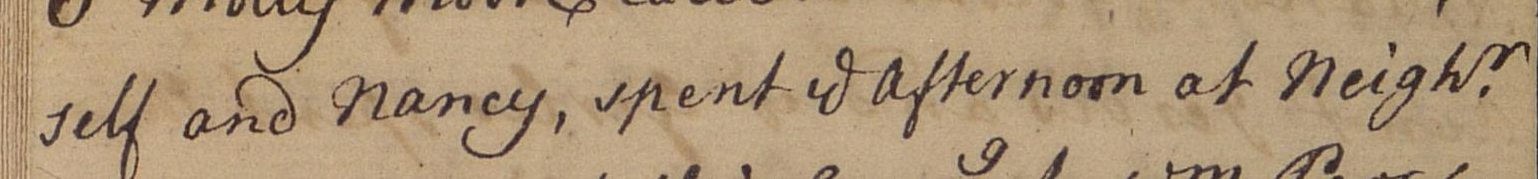self and Nancy, spent y^e afternoon at Neigh^r.
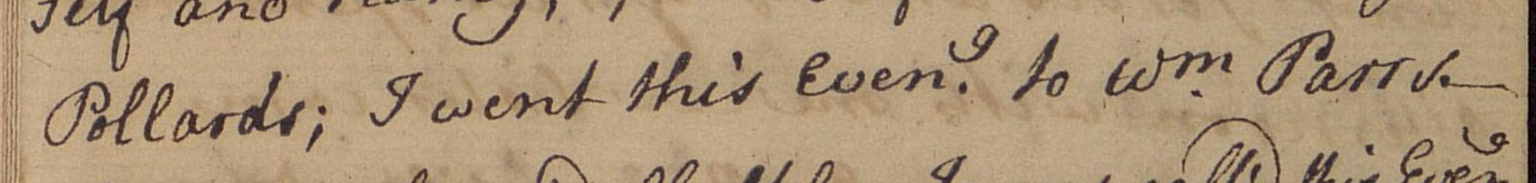Pollards; I went this Even^g. to W^m. Parrs-
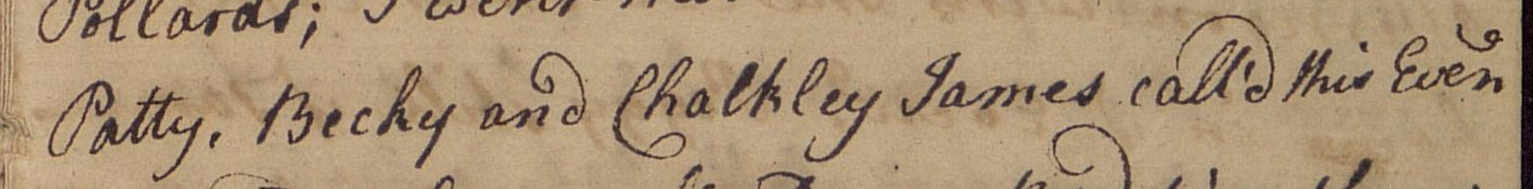Patty, Becky and Chalkley James call'd this Even^g
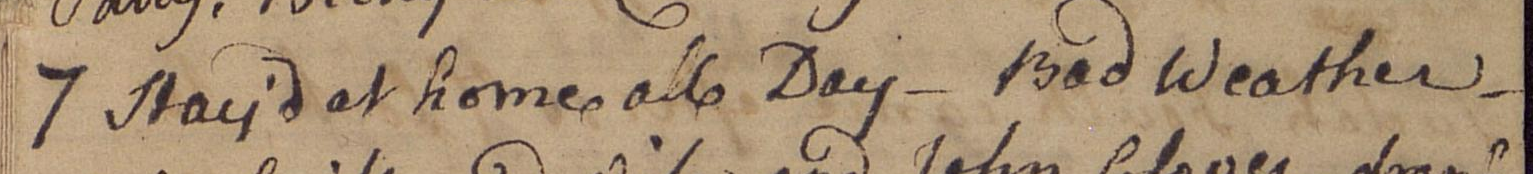7 stay'd at home all Day- Bad Weather
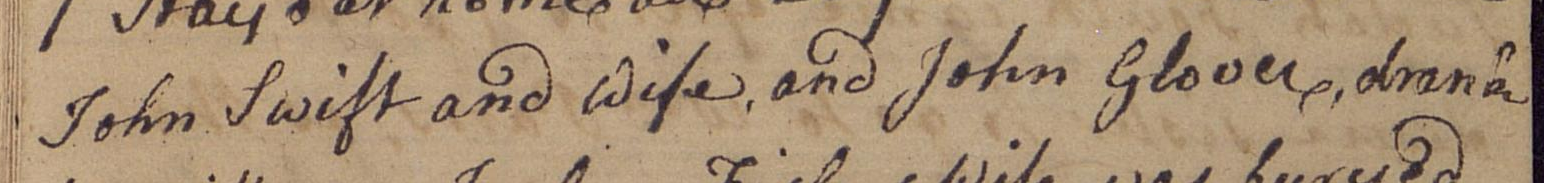John Swift and wife, and John Glover, drank
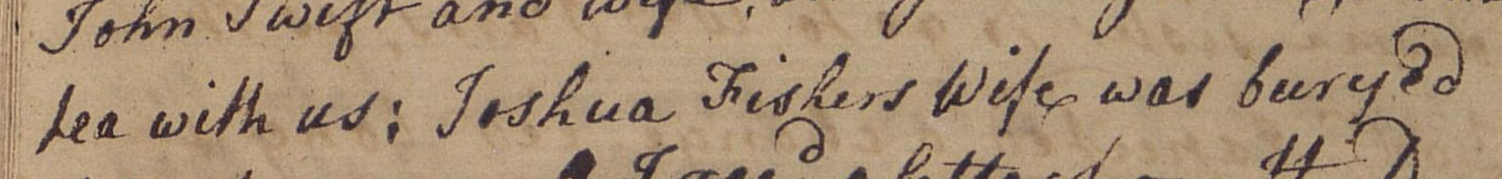tea with us; Joshua Fishers Wife was buryed
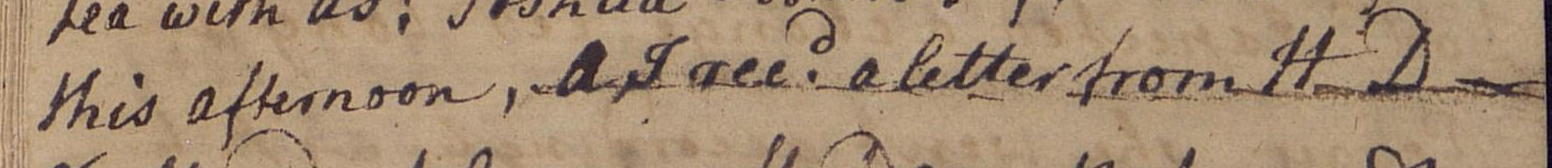this aftenoon, A I rec'd. a letter from HD
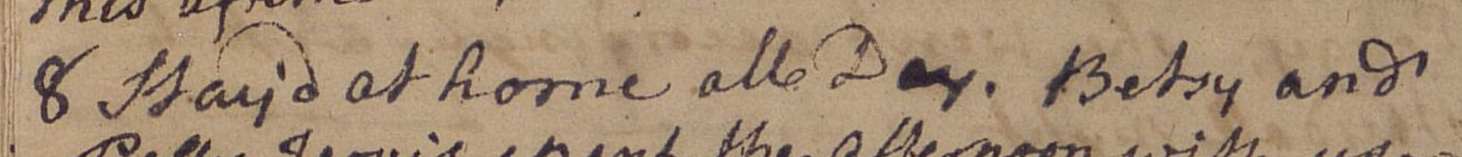8 Stay'd at home all Day. Betsy and
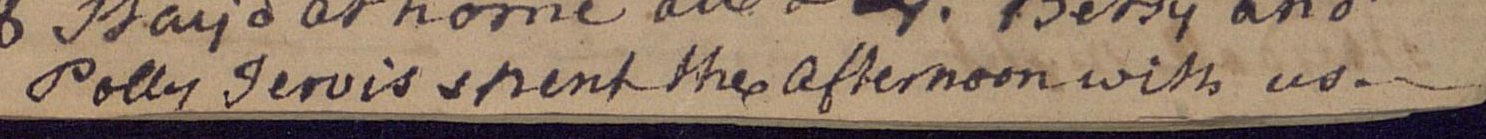Polly Jervis spent the Afternoon with us-
